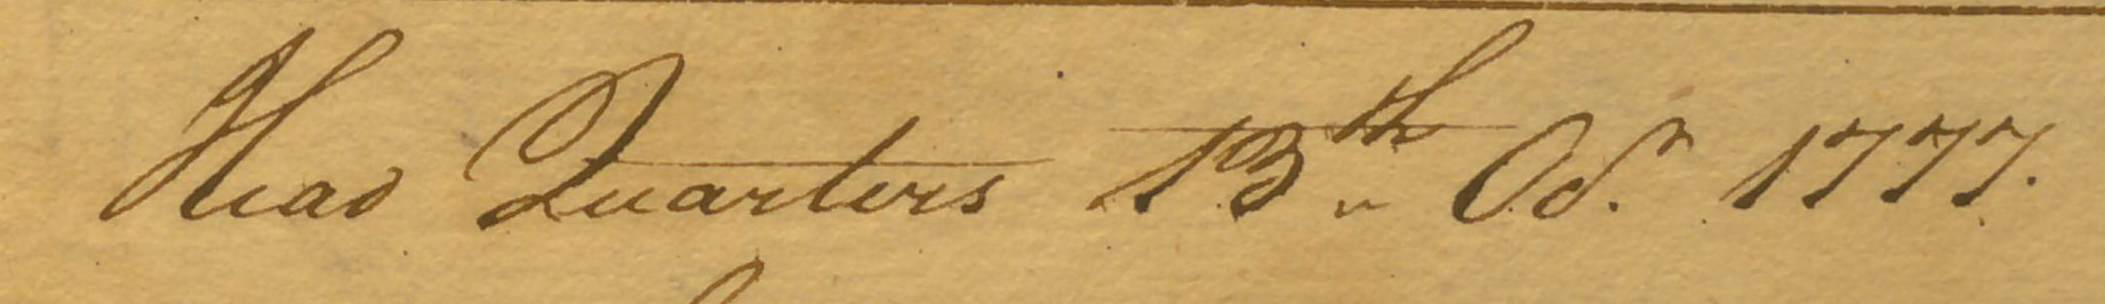Head Quarters 13^th. Oc^r. 1777.
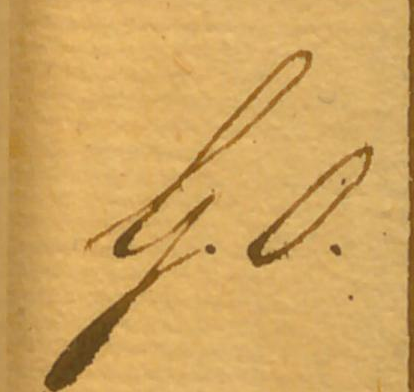G.O.
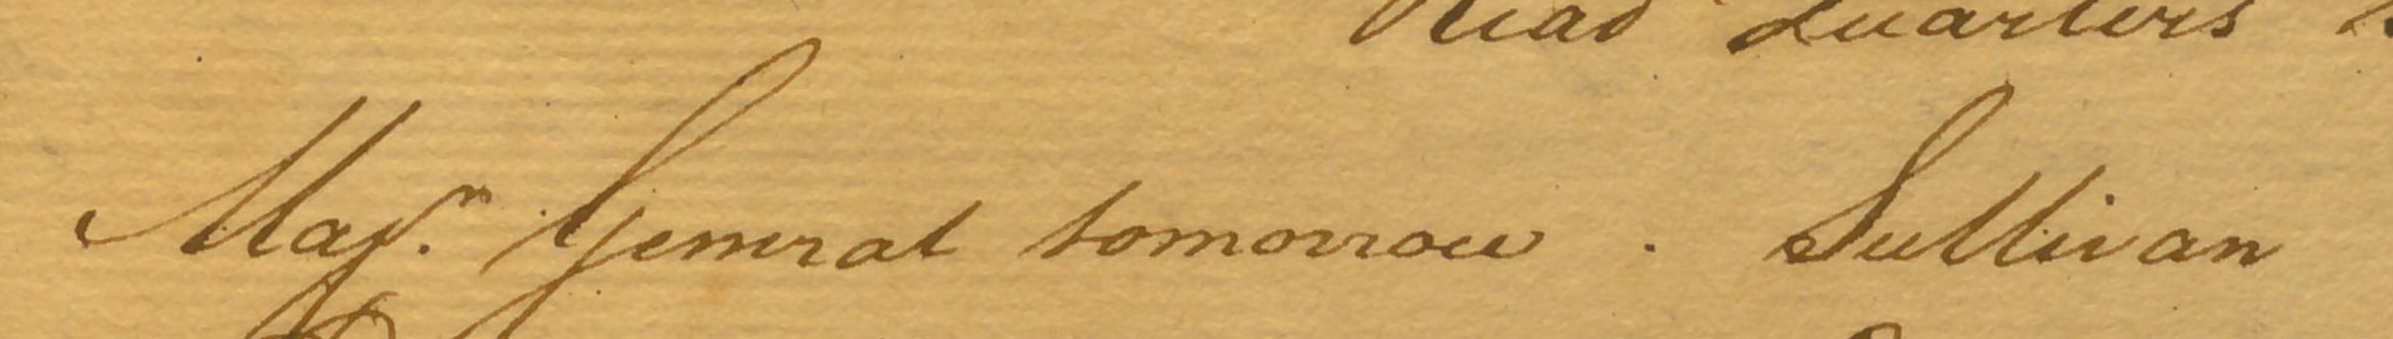Maj^r. General tomorrow. Sullivan
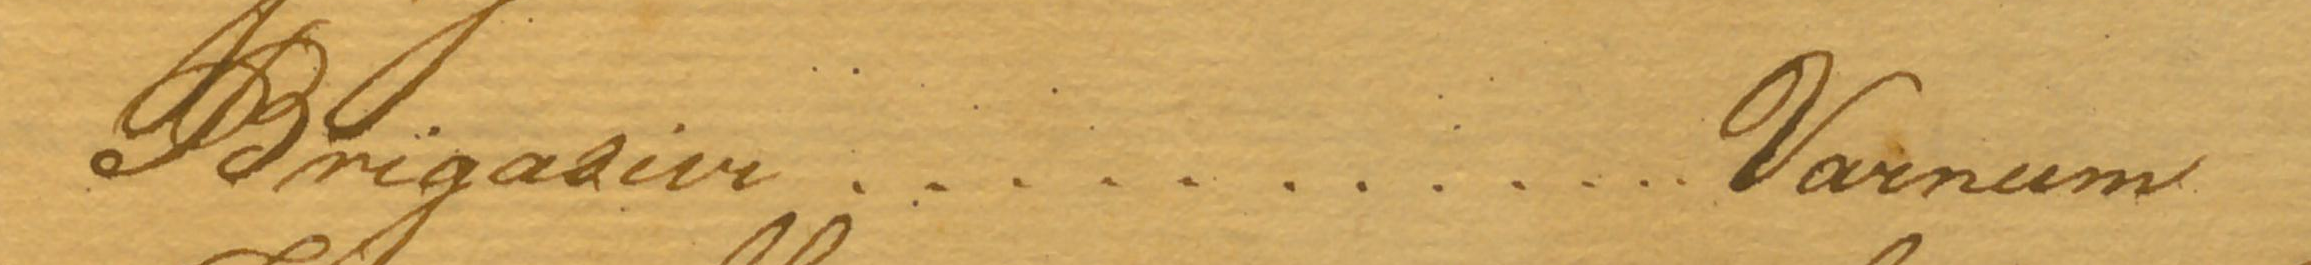Brigadier ............ Varnum
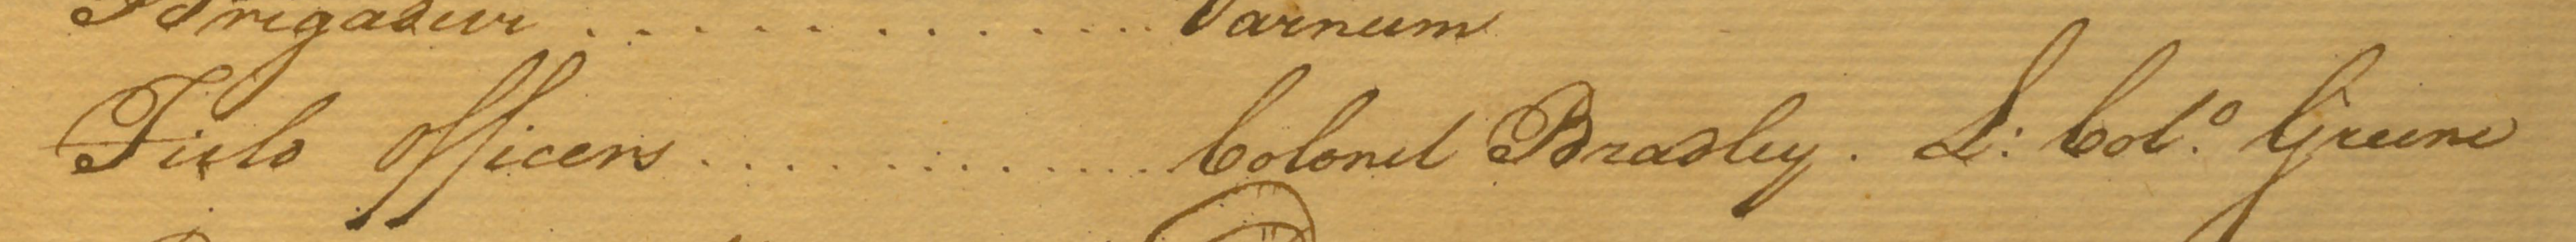Field offiers ............ Colonel Bradley. L: Col^o. Greene
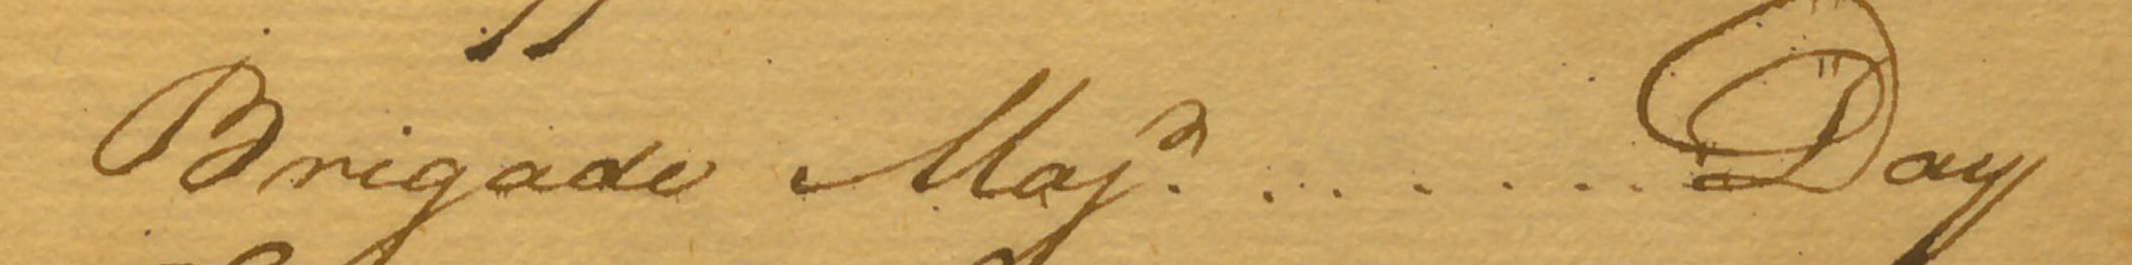Brigade Maj^r. ...... Day
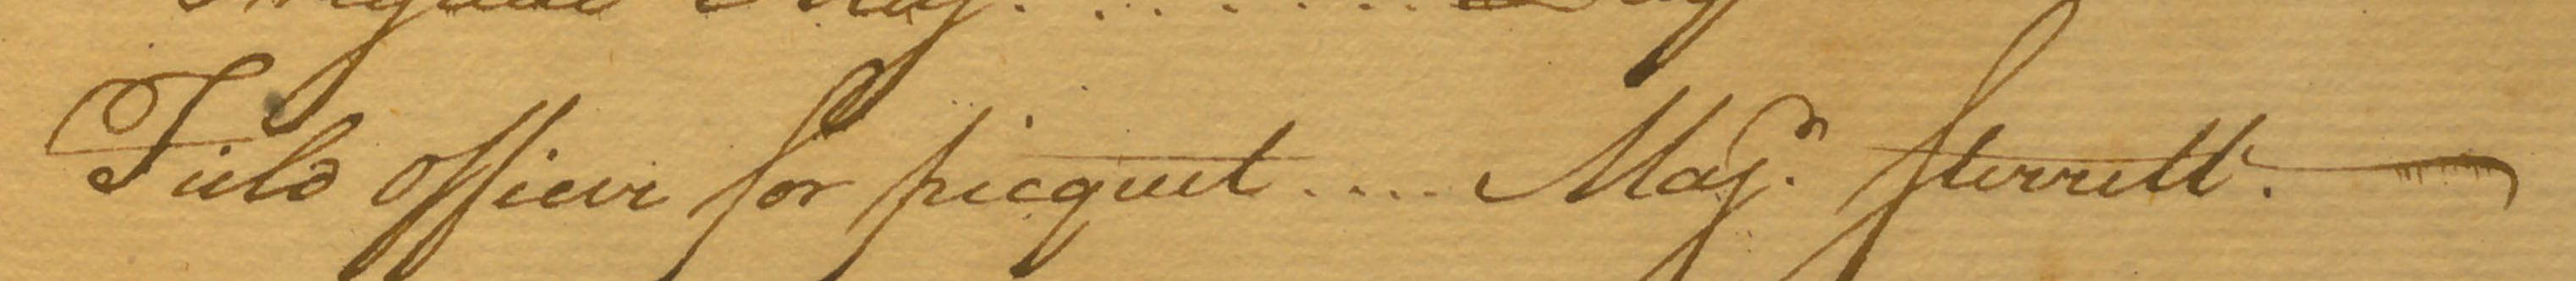Field officer for picquet .... Maj^r. Sterrett.
